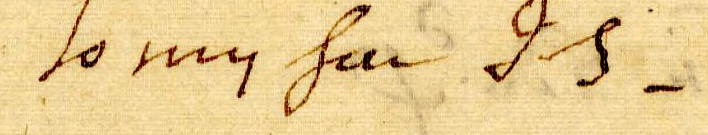To my son JS-
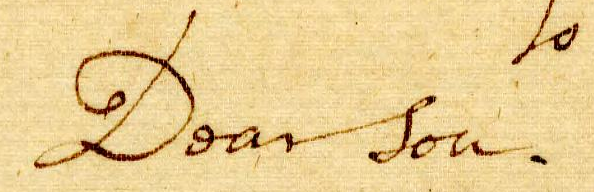Dear Son.
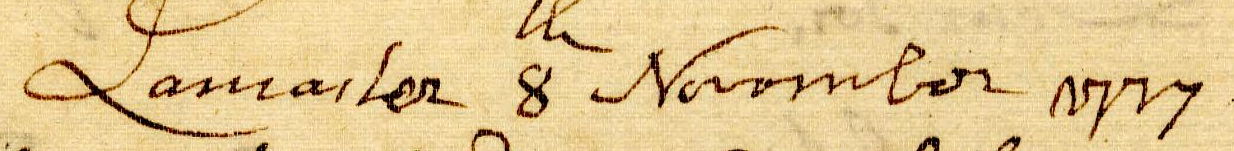Lancaster 8^th November 1777
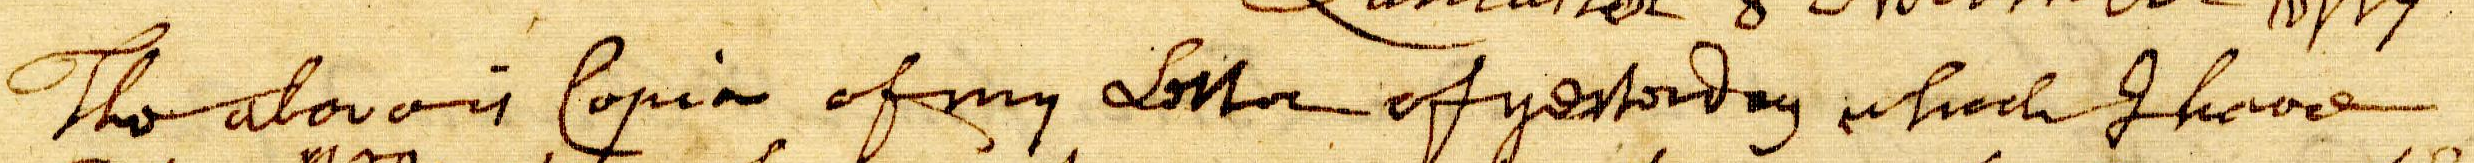The above is Copia of my Letter of yesterday which I have
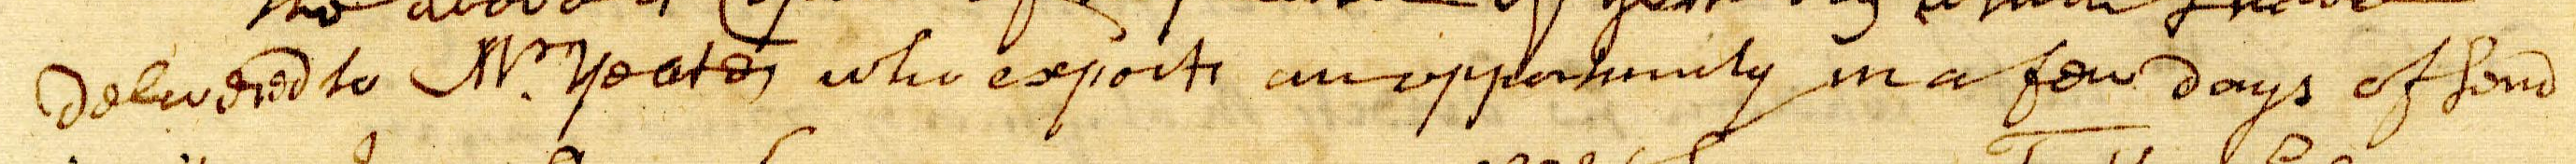delivered to M^r. Yeates who expects an opportunty in a few days of send
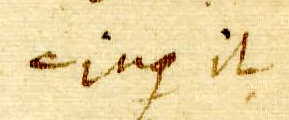-ing it
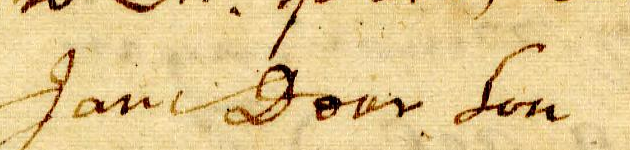I am Dear Son
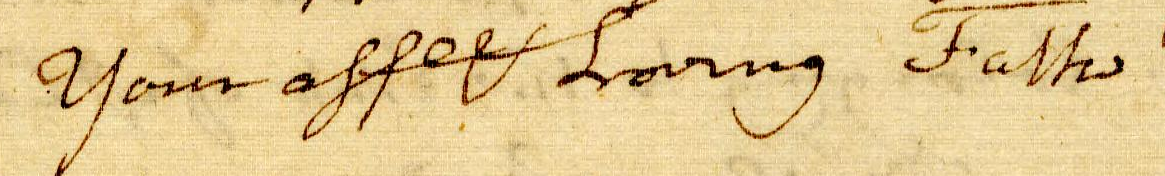Your affect Loving Father
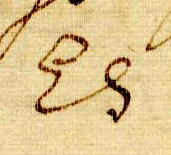ES
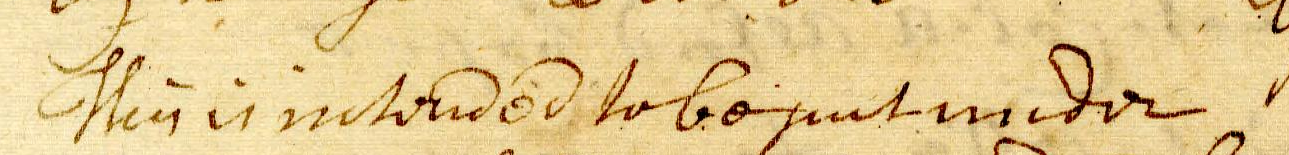This is intended to be sent under
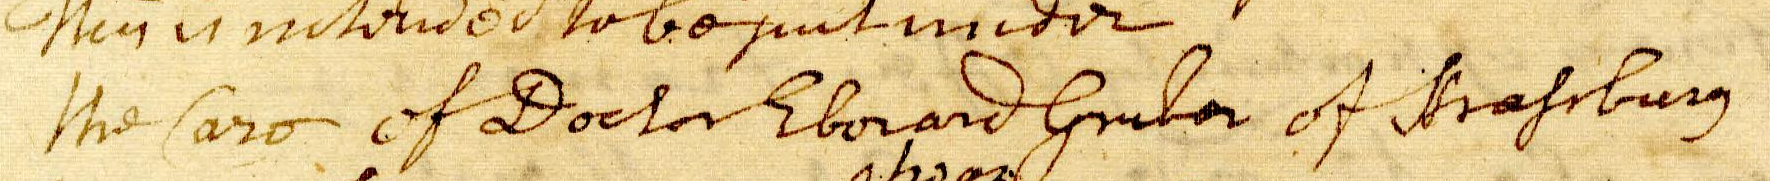the Care of Doctor Eberard Gruler of Strassburg
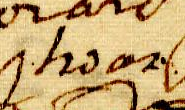hear
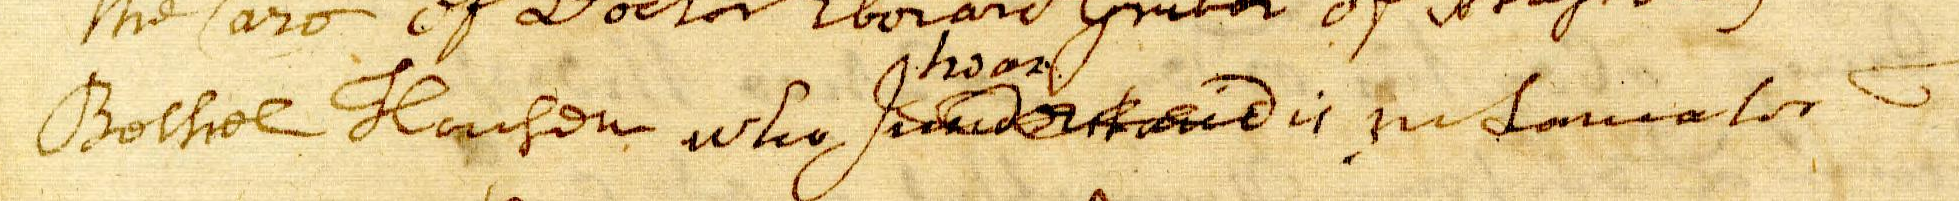Bothel Housen who I [understand] is in Lancaster
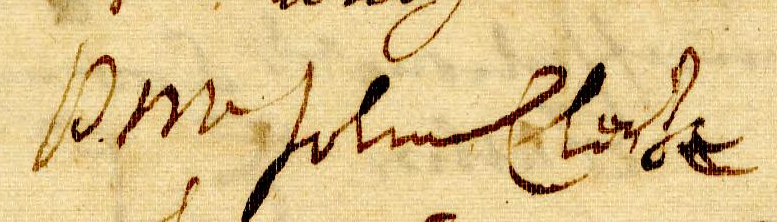PM John Clark
